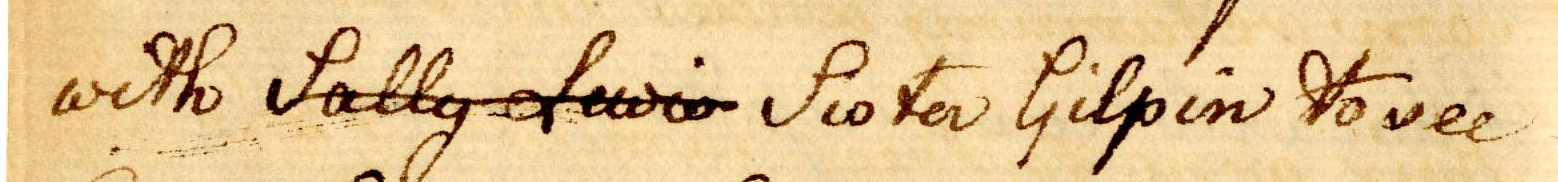with [Sally Lewis] Sister Gilpin to see
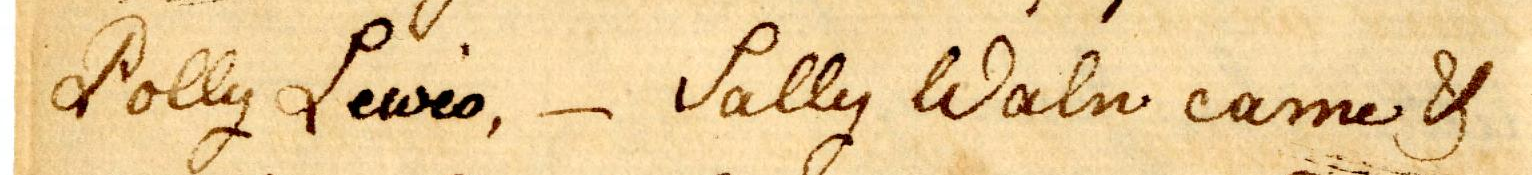Polly Lewis,- Sally Waln came &
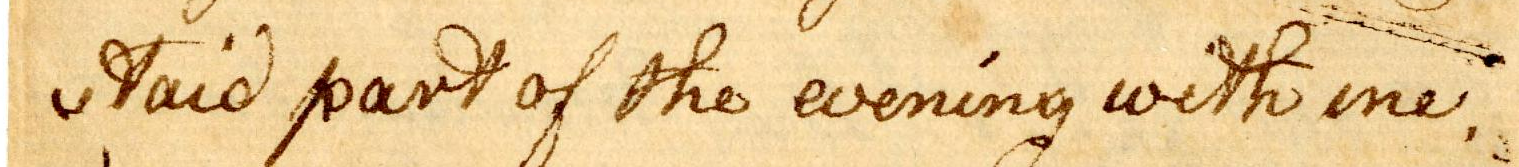staid part of the evening with me,
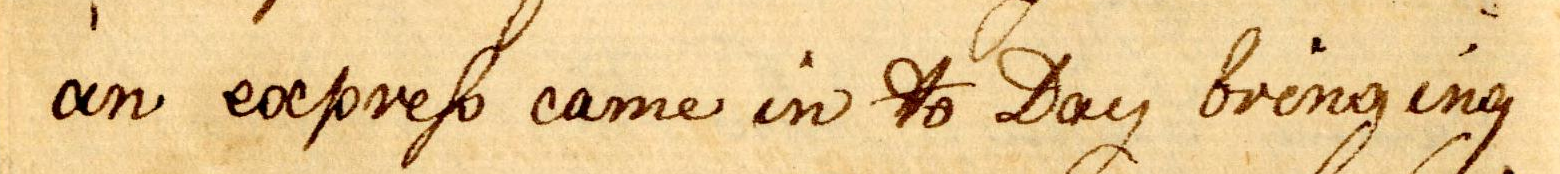an express came in to Day bringing
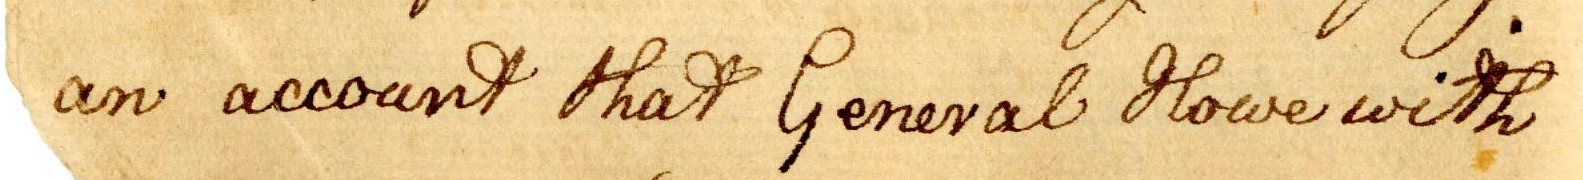an account that General Howe with
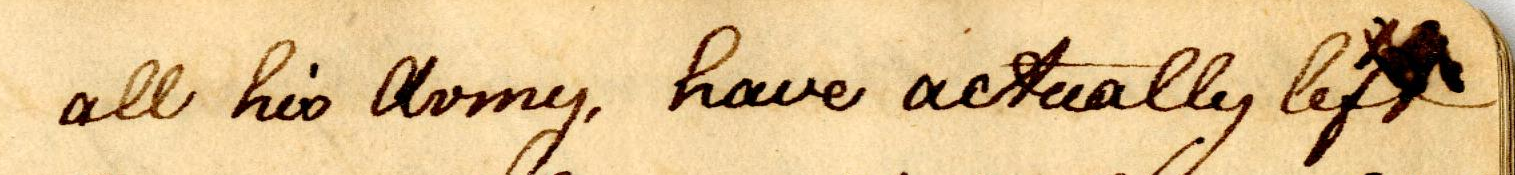all his Army, have actually left
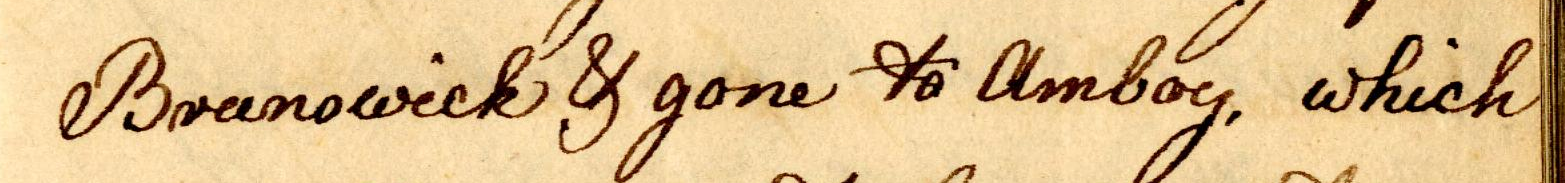Brunswick & gone to Amboy, which
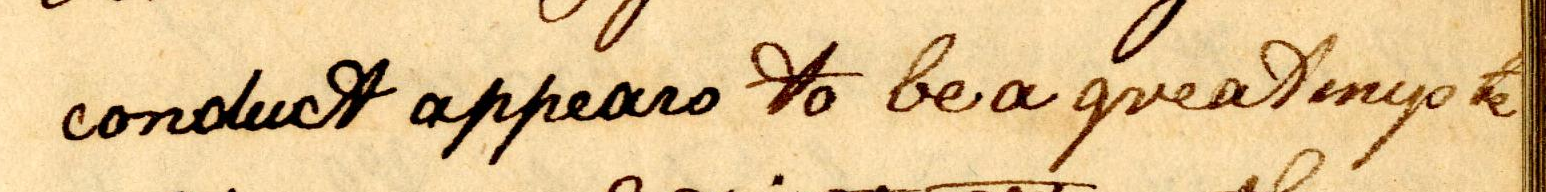conduct appears to be a great myste
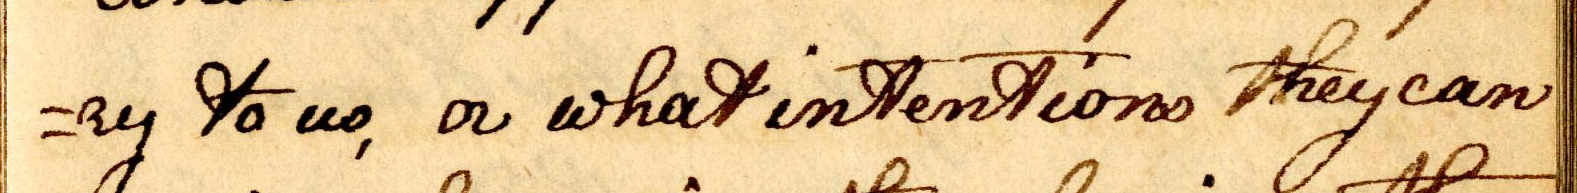-ry to us, or what intentions they can
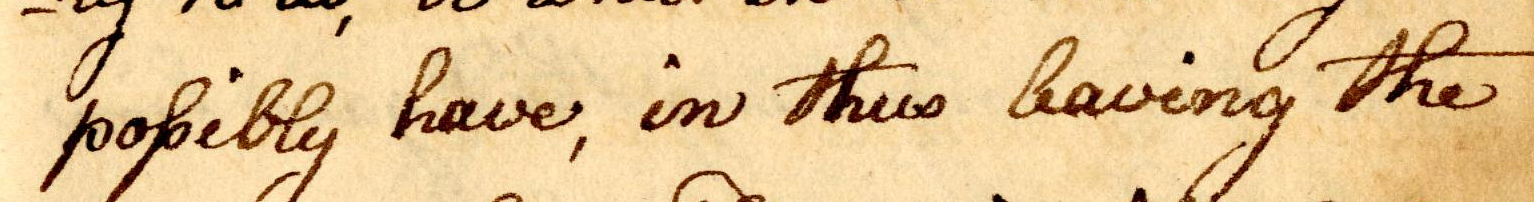possibly have, in thus leaving the
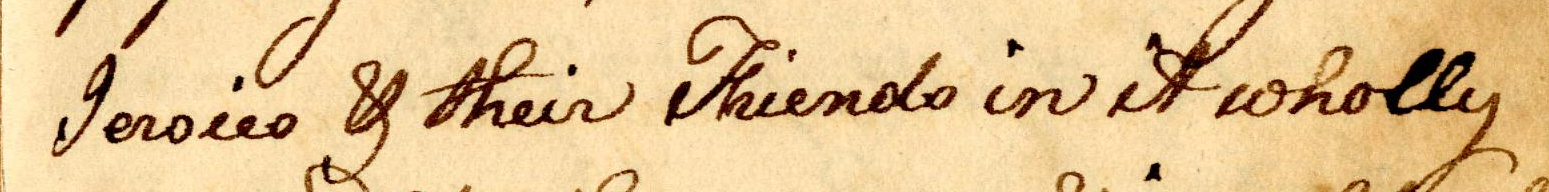Jersies & their Friends in it wholly
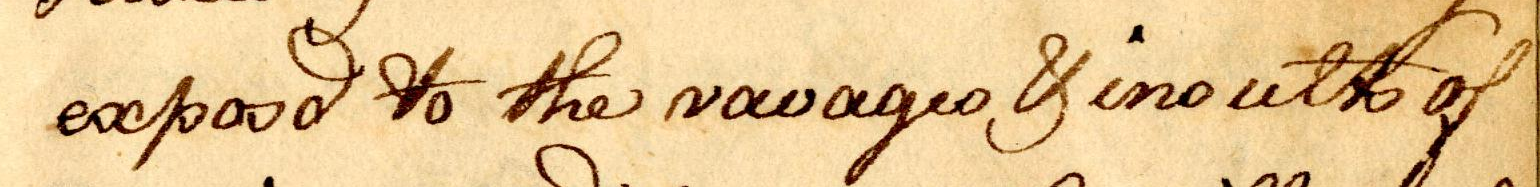exposd to the ravages & insults of
